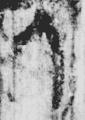人
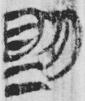則（則）
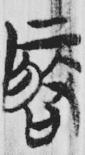啓
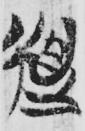道
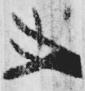之
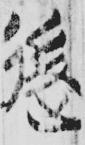後
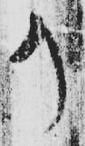人
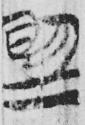則（則）
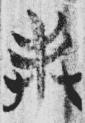奉
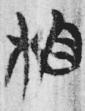相
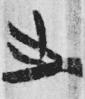之
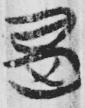是
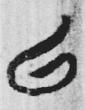㠯（以）
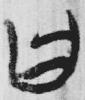曰
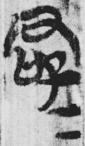子君
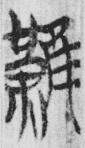難
